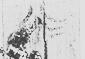八十=
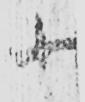七
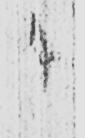千
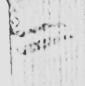二
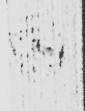百
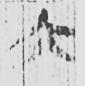六
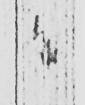千
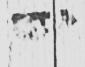四
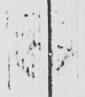百
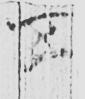五
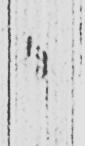千
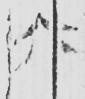六
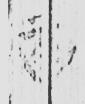百
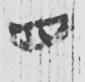四
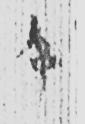千
